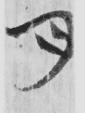月
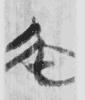帀
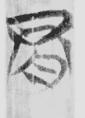{尹月}
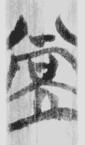當
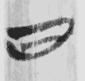日
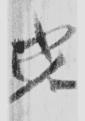𡚦
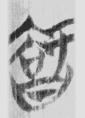智
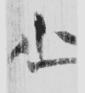少
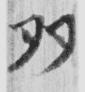多
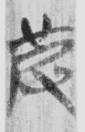皮
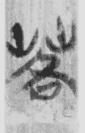茖
